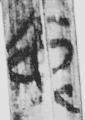𠁩（中）
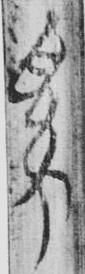○（奚）
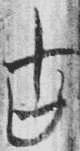古（故）
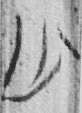少（小）
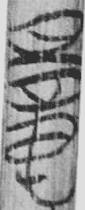暲
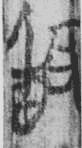䎽（問）
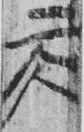天
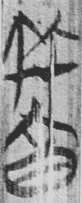○（孰）
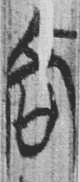高
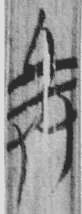與
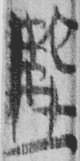○（地）
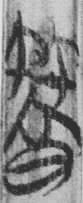○（孰）
